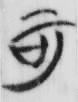可
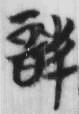○（證）
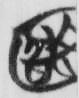匿（暱）
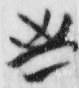至
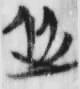從（從）
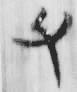父
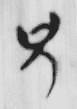兄
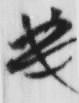弟
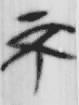不
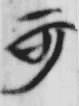可
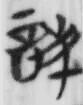○（證）
